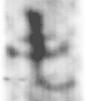屯
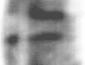二
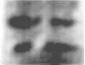二
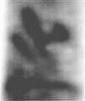之
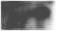一
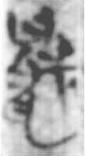○（豻）
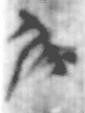尾
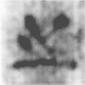之
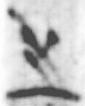之
